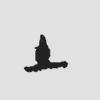土
